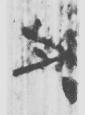之
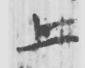上
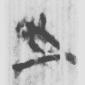之
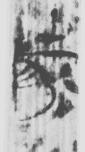所
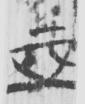亞
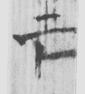下
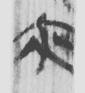亦
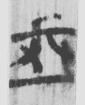亞
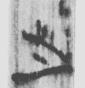之
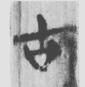古
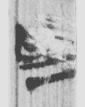爲
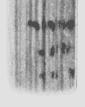三
